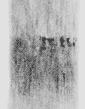一
